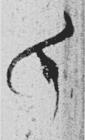氏（是）
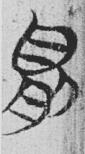{胃刀}（謂）
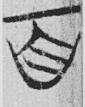百
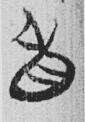眚（姓）
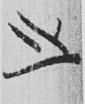之
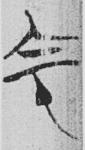宔（主）
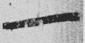一
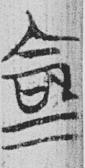命
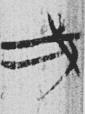弌（一）
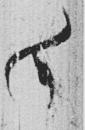氏（是）
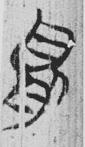{胃刀}（謂）
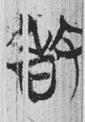○（遭）
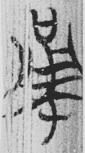咉（殃）
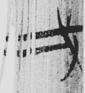弌（一）
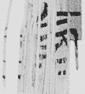命
